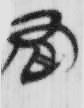冒
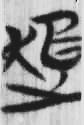○（宣）
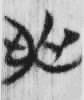卯
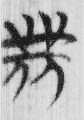㒭
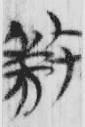殺
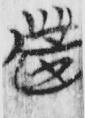○（僕）
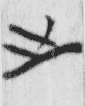之
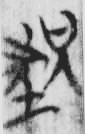○（兄）
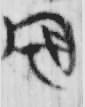陰
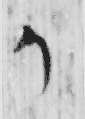人
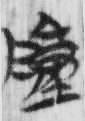○（陳）
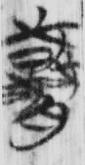○（脖）
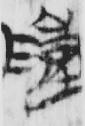○（陳）
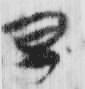旦
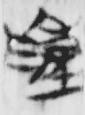○（陳）
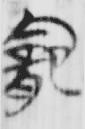寵
